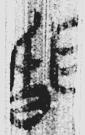○（聞）
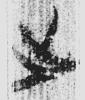之
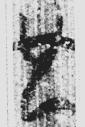也
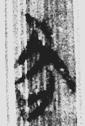各
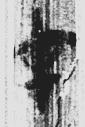才（在）
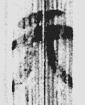亓（其）
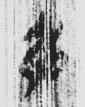身
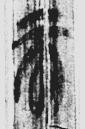而
